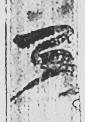乃
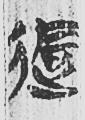{辶石}
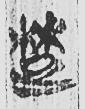楚
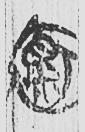褱
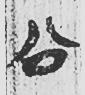公
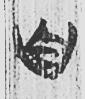自
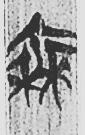秦
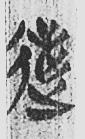逃
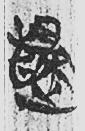歸
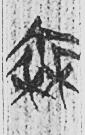秦
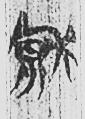穆
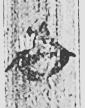公
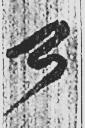乃
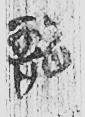訋
